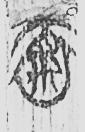褱
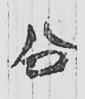公
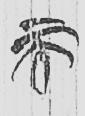而
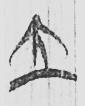立
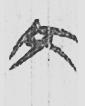文
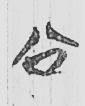公
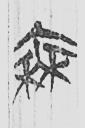秦
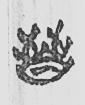晉
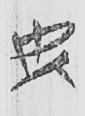𡚦
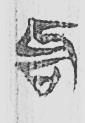{㠯ㅋ}
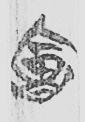會
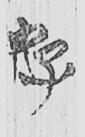好
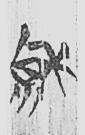穆
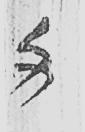力
